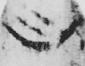出
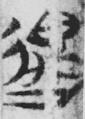遇
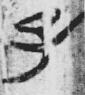子
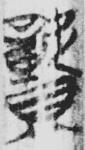贛
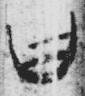曰
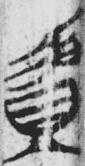賜
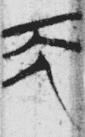而（爾）
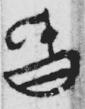昏（聞）
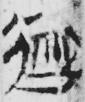巷
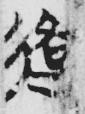○（路）
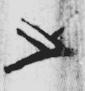之
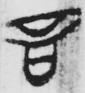言
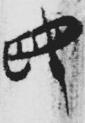母（無）
